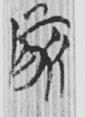所
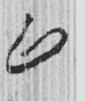㠯（以）
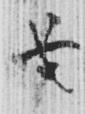弋（代）
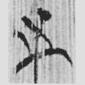之
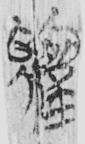○（觀）
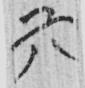亓（其）
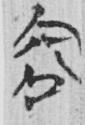容
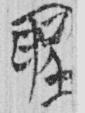聖（聽）
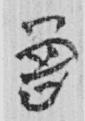言
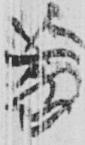者
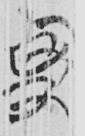○（使）
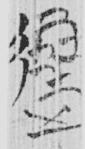堋
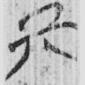亓
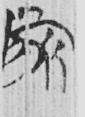所
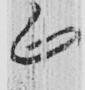㠯（以）
